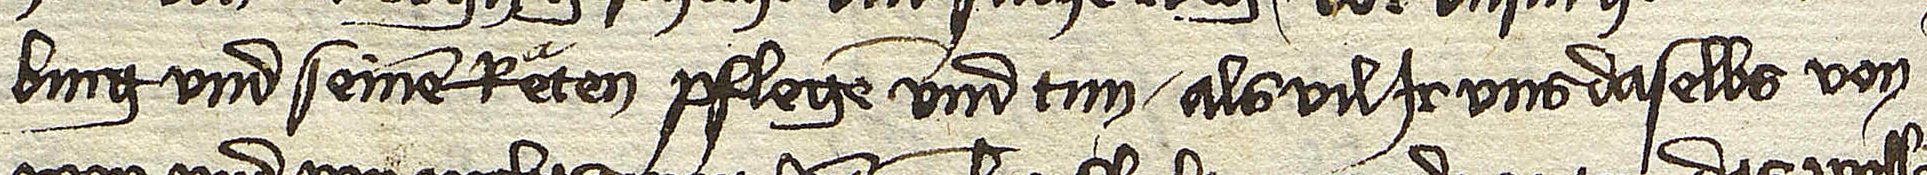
burg vnd ſeine* Rëten pflege* vnd tun / als vil Ir vns daſelbs von
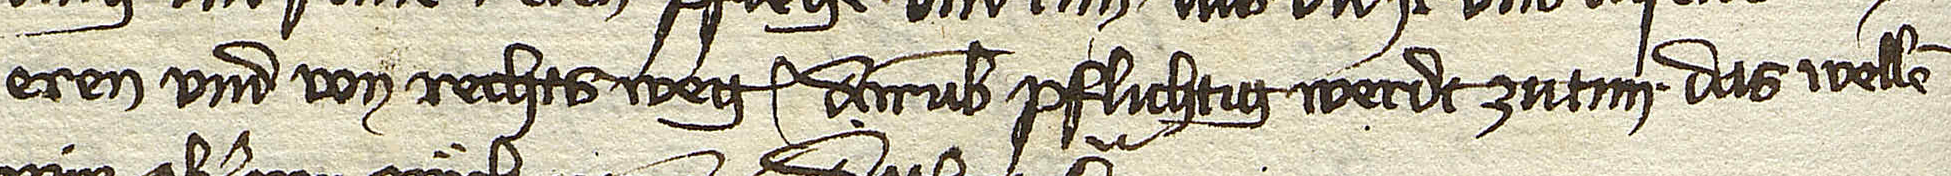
eren vnd von rechts weg* daru*b pflichtig werdt ʒutun . das welle*
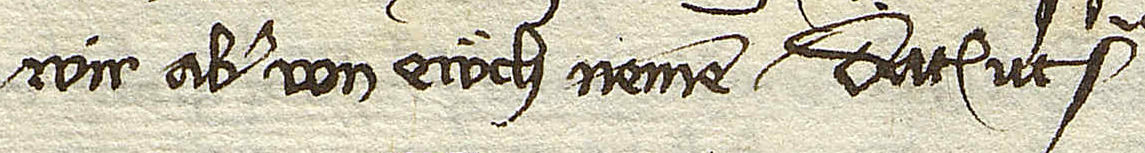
wir ab* von ewch neme* / Dat* ut ſ*
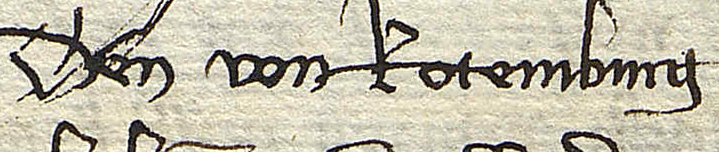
Den von Rotemburg
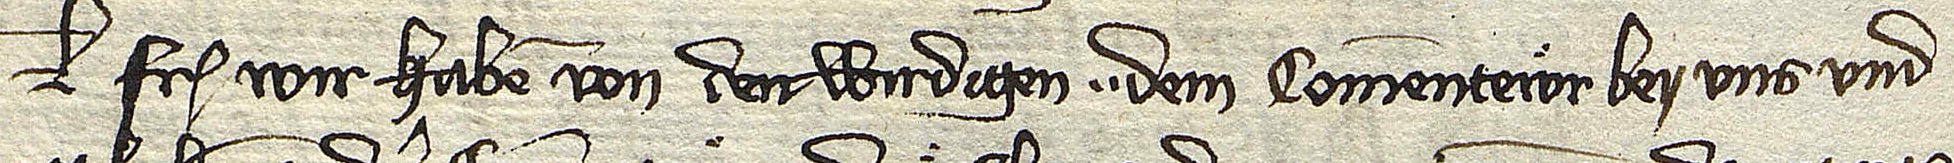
L* fr* wir habe* von den Wirdigen ~ dem Com*entewr* bey vns vnd
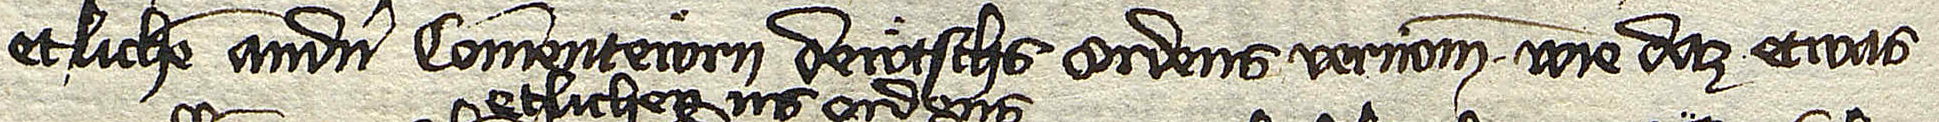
etliche* and*n Comentewrn* dewtſchs Ordens vernom* . wie daʒ etwas
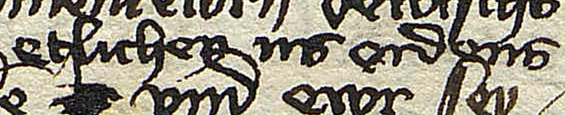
etlichen irs ordens
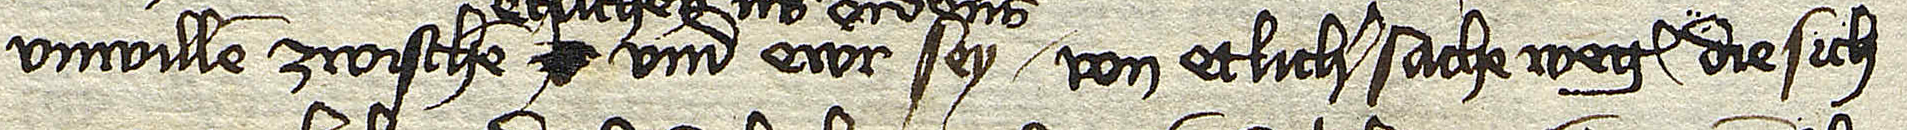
vnwille* ʒwiſche* I vnd ewr ſey / von etlich* ſache weg* die ſich
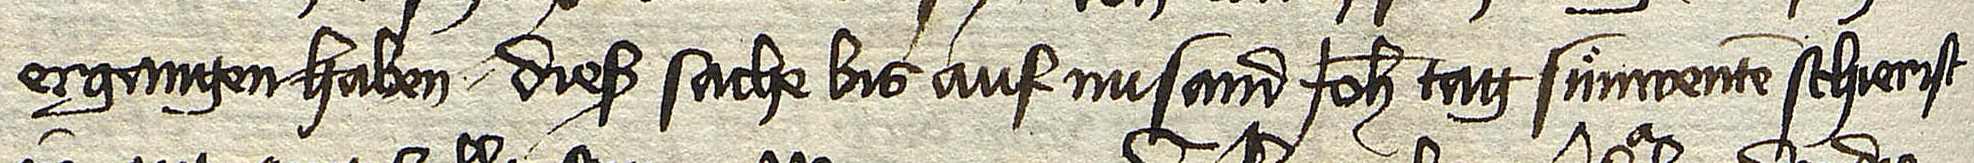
ergangen haben / dieſ* ſache bis auf nu ſand Ioh* tag ſünwente* ſchieriſt
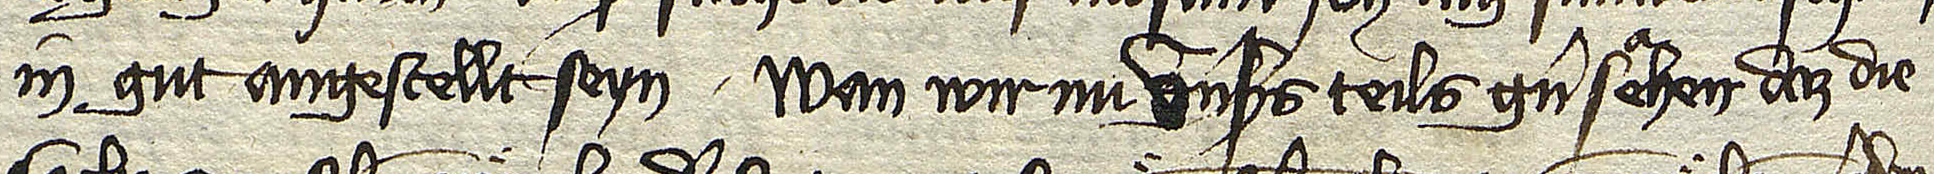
in gut angeſtellt ſeyn / Wan wir nu Vnſ*s teils g*n ſëhen daʒ die
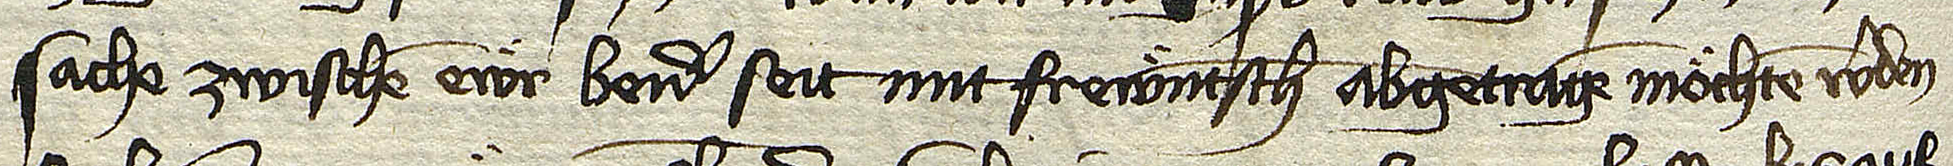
ſache ʒwiſche* ewr beid*ſeit mit frewntſch* abgetrage* möchte* w*den
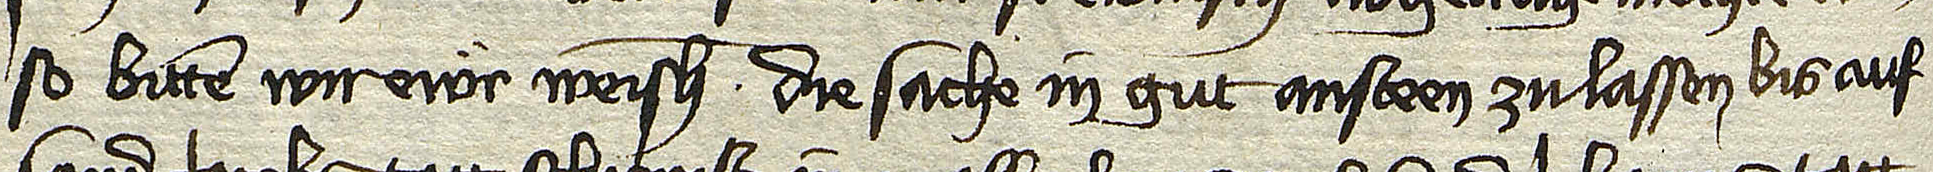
ſo bitte* wir ewr weiſh* . die ſache in gut anſteen ʒu laſſen bis auf
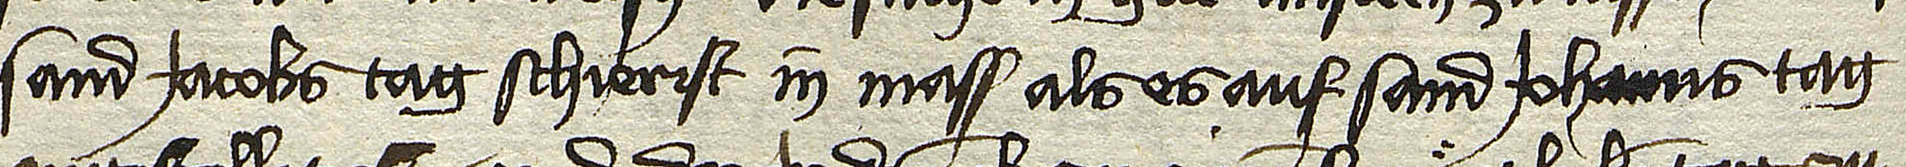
ſand Iacobs tag ſchieriſt in maſſ als es auf ſand Iohanns tag
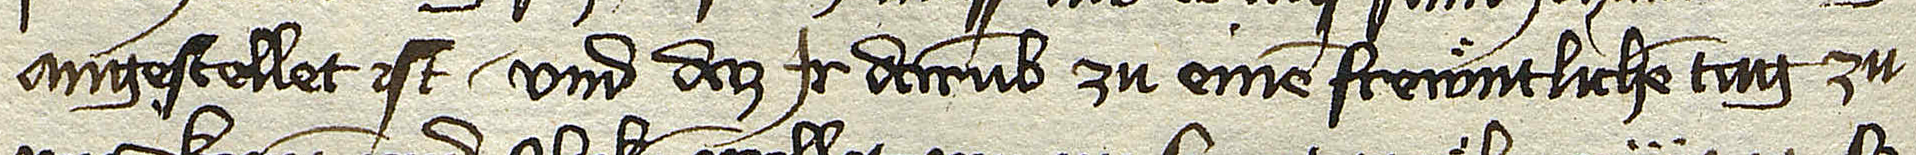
angeſtellet iſt / vnd daʒ Ir daru*b ʒu eine* frewntliche* tag ʒu
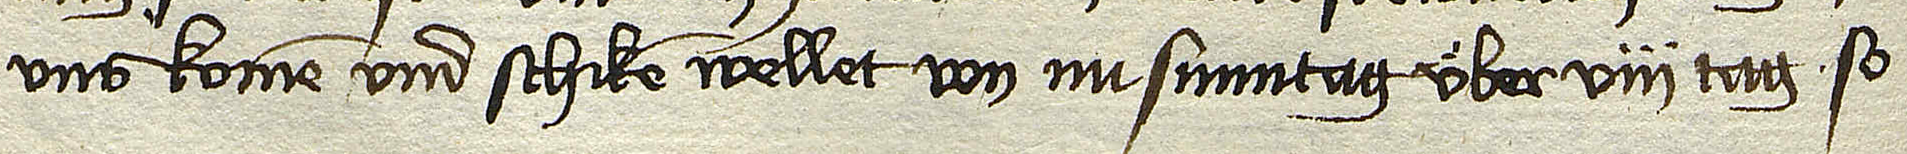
vns kome* vnd ſchike* wellet von nu ſunntag v̈ber viii tag . ſo
